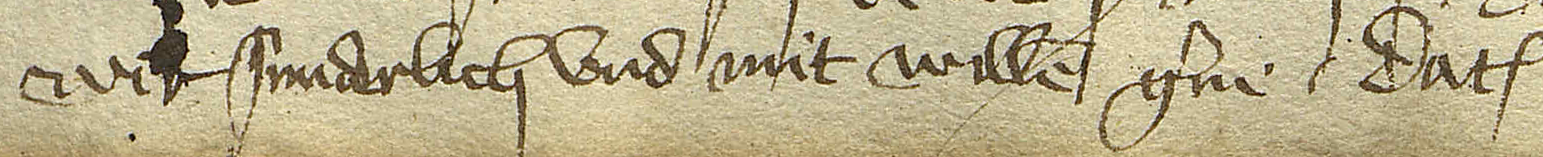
wir ſunderlich vnd mit wille* g*ne / Dat*
